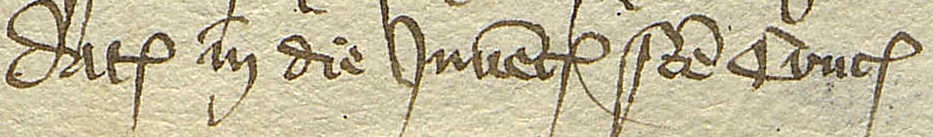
Dat* iii* die Inue*c* ſte* Cruc*
